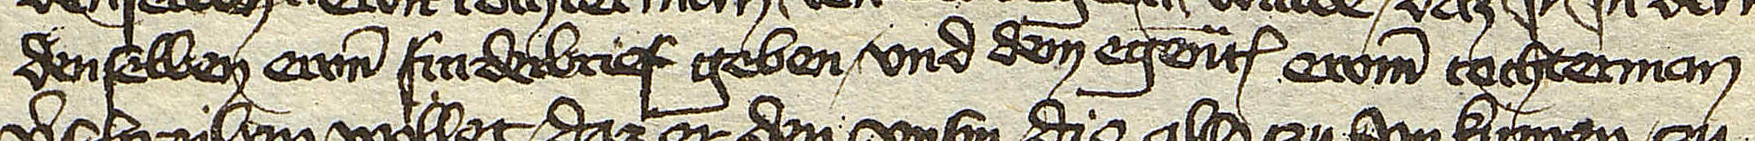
denſelben ewn* furderbrief geben / vnd dem egent* ewm* tochterman
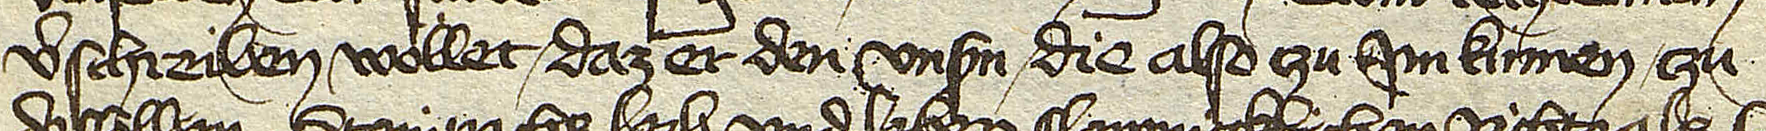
v*ſchreiben wöllet / daʒ er den vnſ*n / die alſo cʒu Im kumen / cʒu
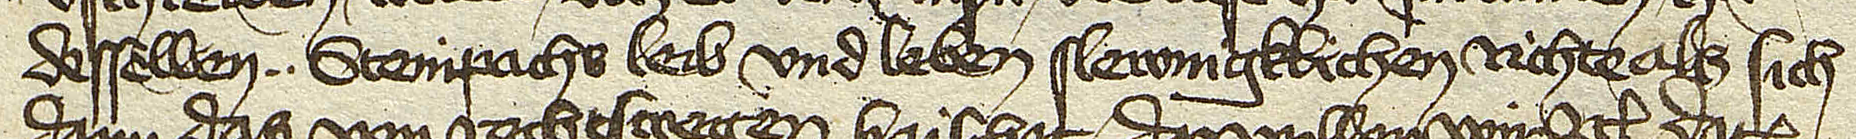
deſſelben ~ Steinpachs leib vnd leben ſlewnigklichen richte als ſich
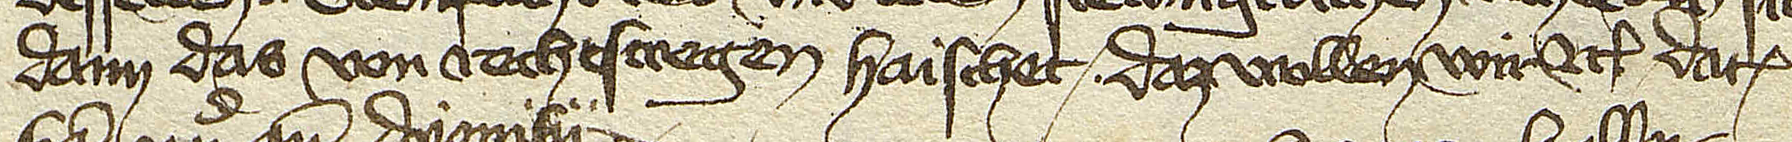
dann das von rechtſwegen haiſchet / . daʒ wollen wir ec* dat*
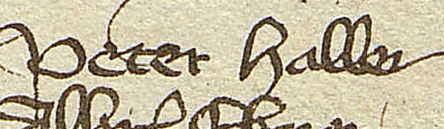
Peter haller
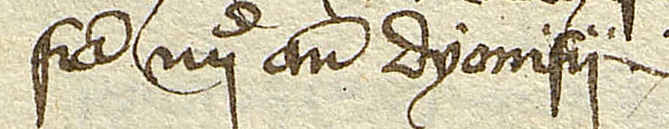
fia* iiii*an* dyoniſii
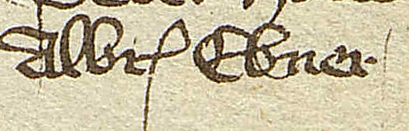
Albr* Ebner
